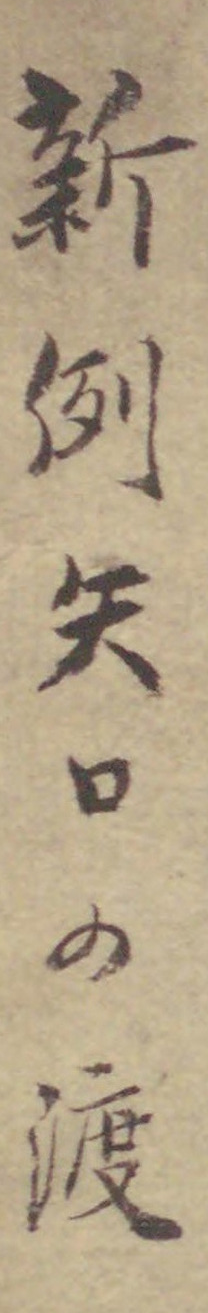新例矢口の渡全

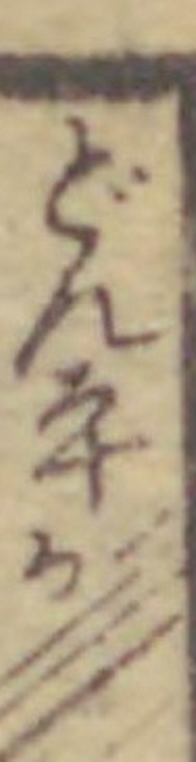どん平か
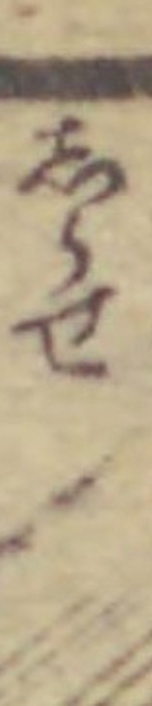しらせ
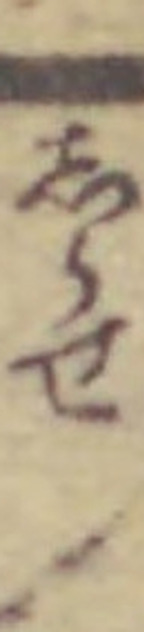しらせ
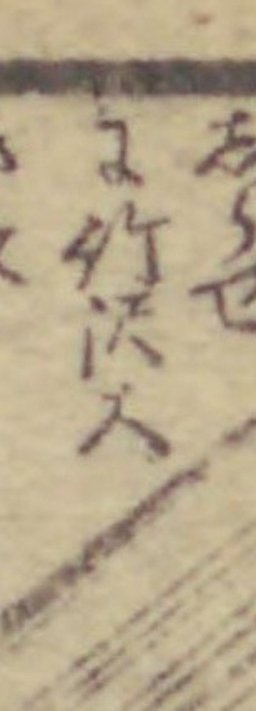に竹沢大
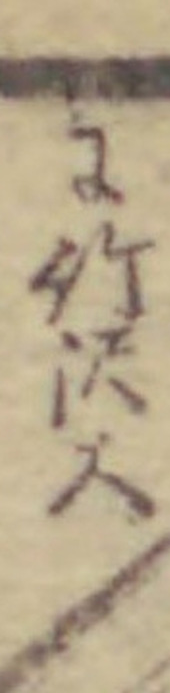に竹沢大
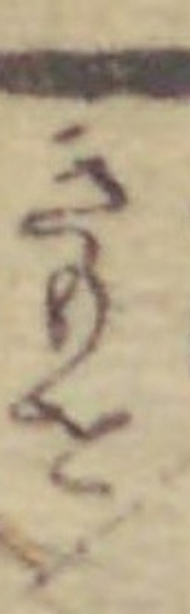きもを
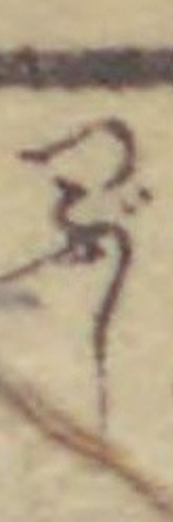つぶし
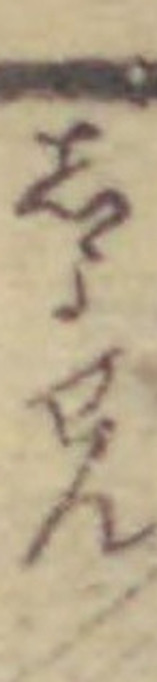しよせん
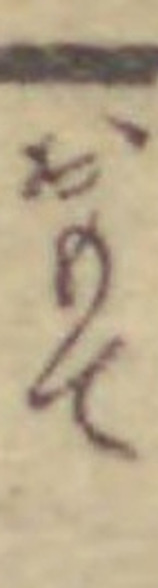おもて
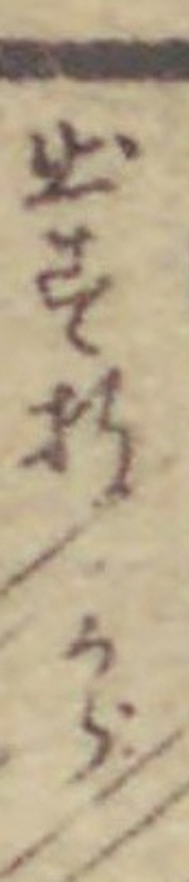出す折からあゝ
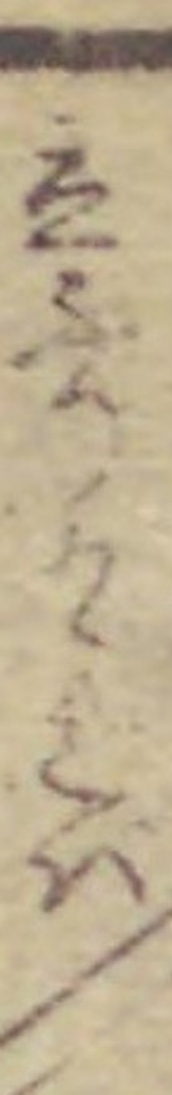立ふりかゝれは此
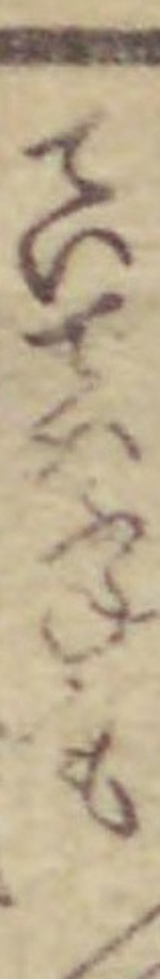ていてはふねも
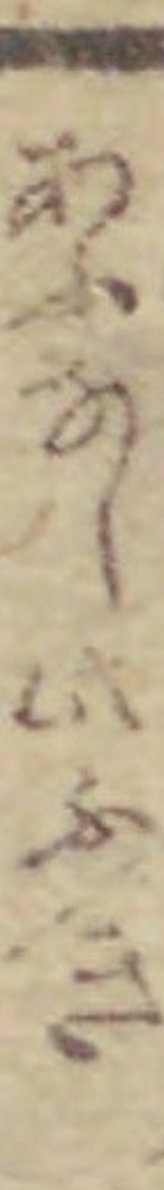あふなし此ふき
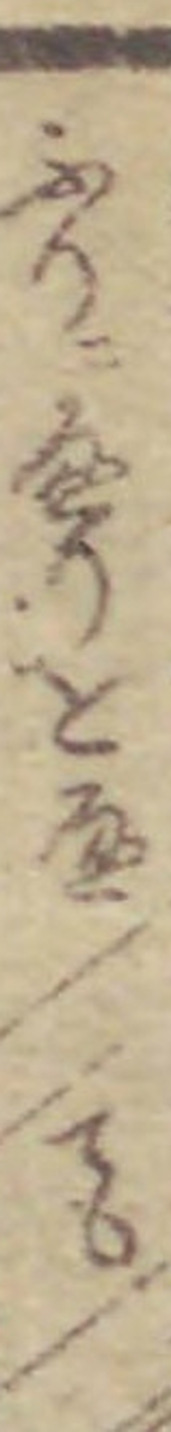ふり通りを通ても
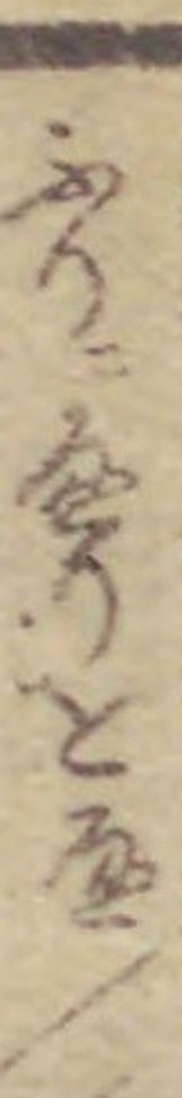ふり通りを通ても
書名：新例矢口渡 3巻
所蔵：国立国会図書館 National Diet Library, JAPAN
